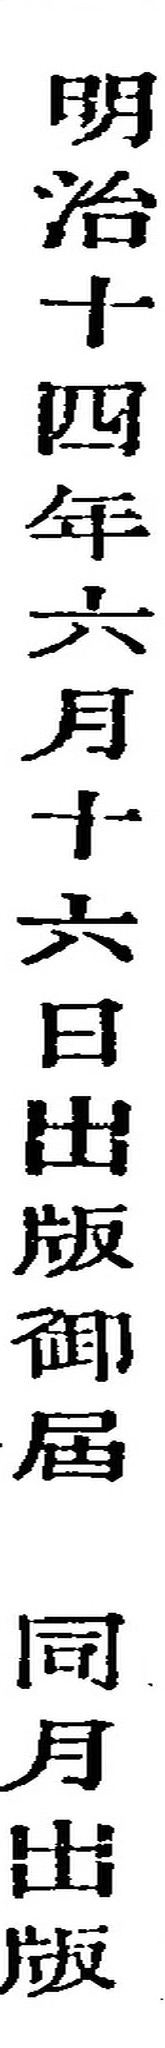明治十四年六月十六日出版御届同月出版
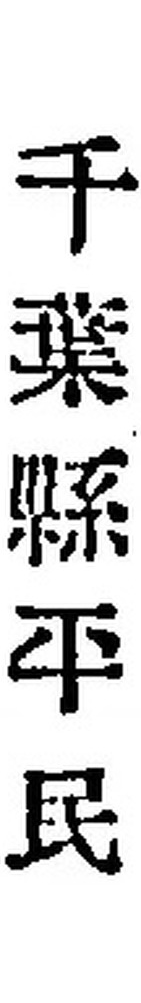千葉縣平民
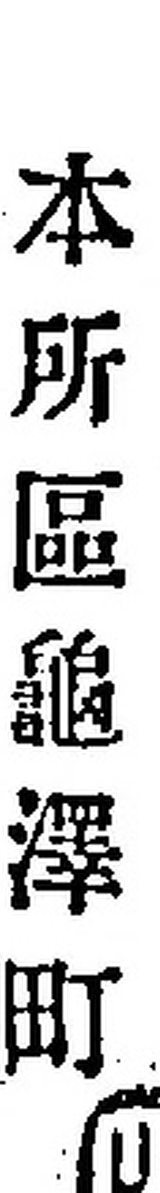本所區龜澤町
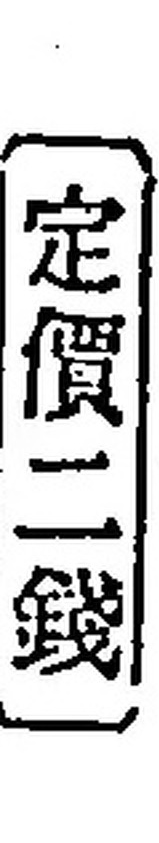定價二銭
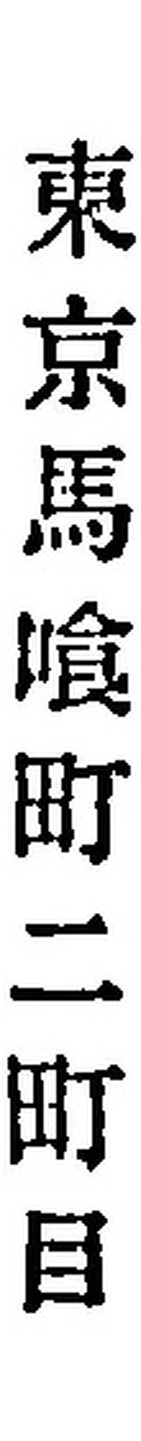東京馬喰町二町目
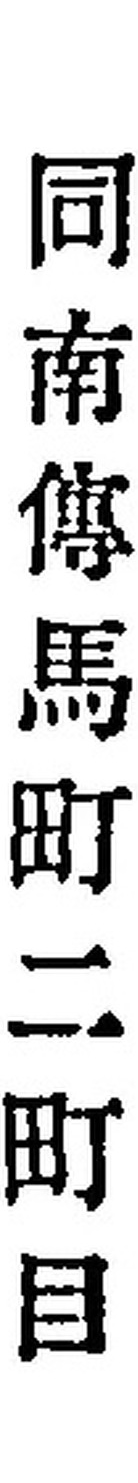同南傳馬町二町目
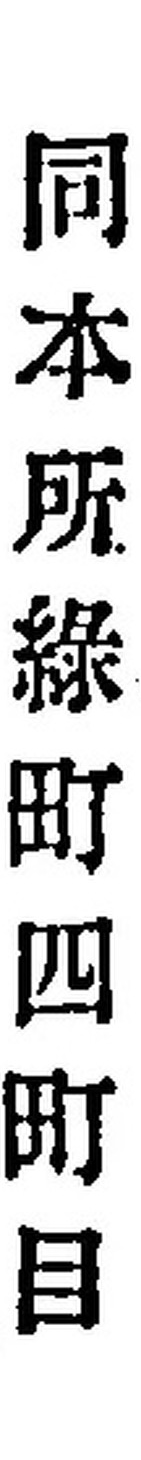同本所緑町四丁目
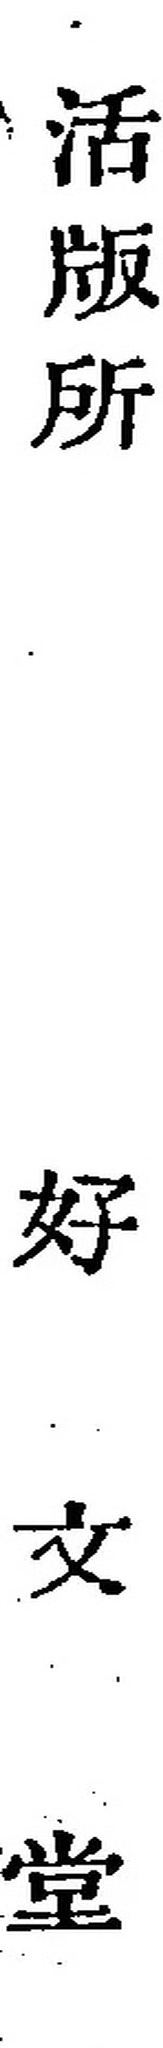活版所好文堂
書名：発疹窒扶私予防の訓
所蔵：国立国会図書館 National Diet Library, JAPAN
